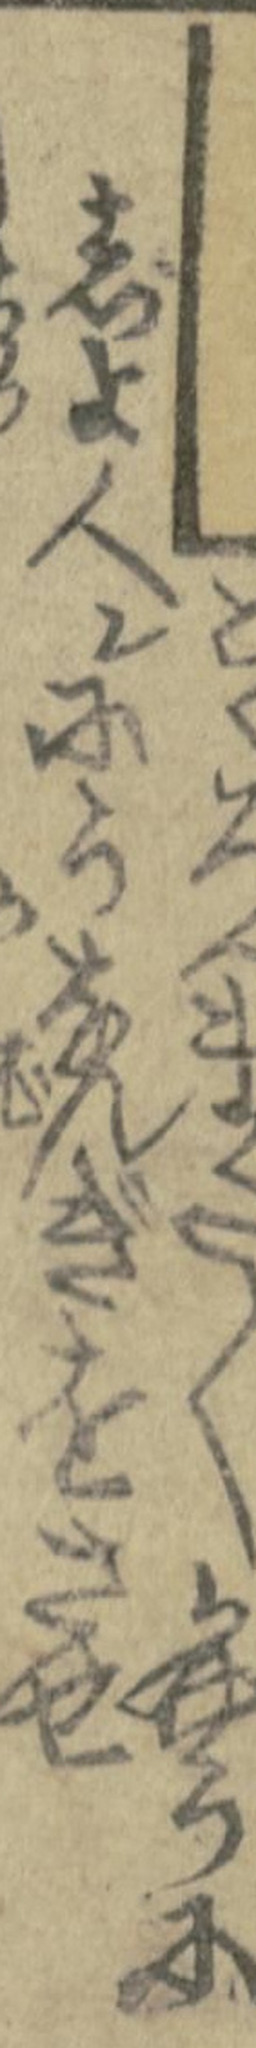しよ人ンにらなんぎをさせ
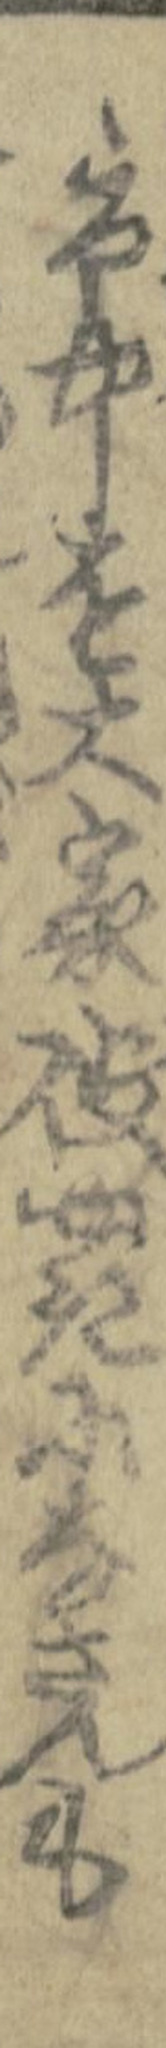市中を大家破やきになさんも
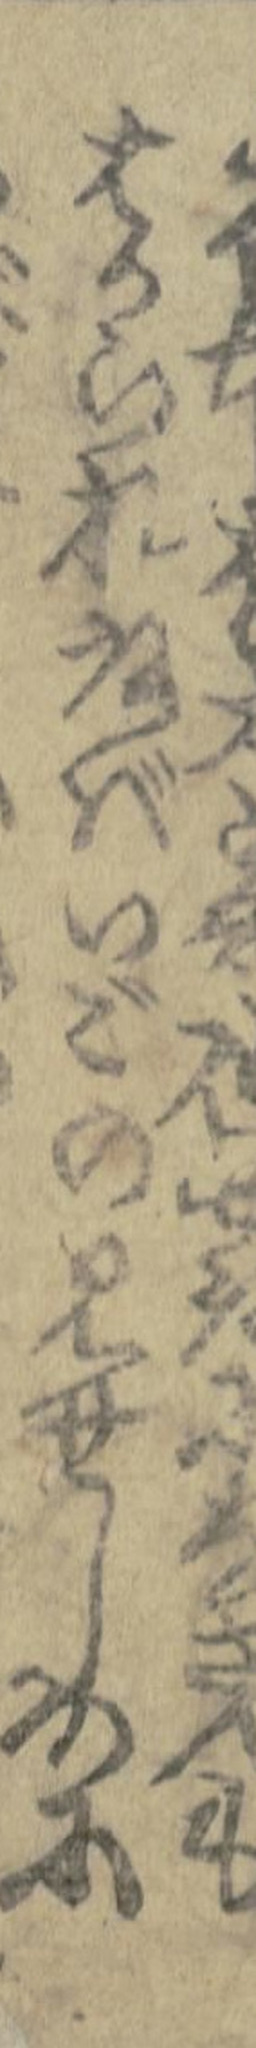はかられなばいごのみせしめに
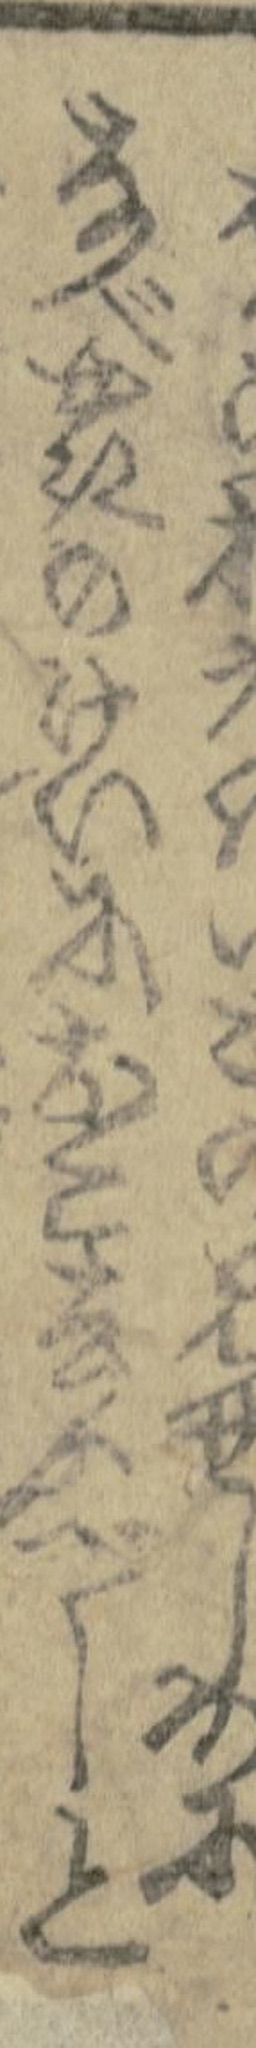なべやきのけいにおこなふべしと
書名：生捕ました三度の大地震
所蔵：東京大学地震研究所図書室 Earthquake Research Institute Library, The University of Tokyo, JAPAN
